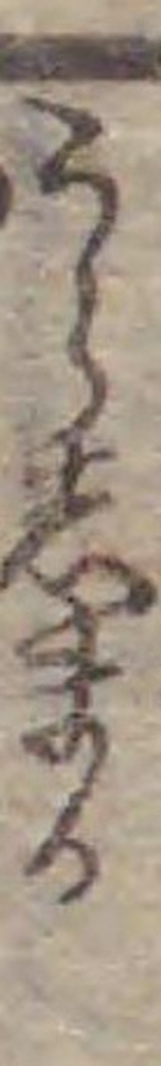うらしまに
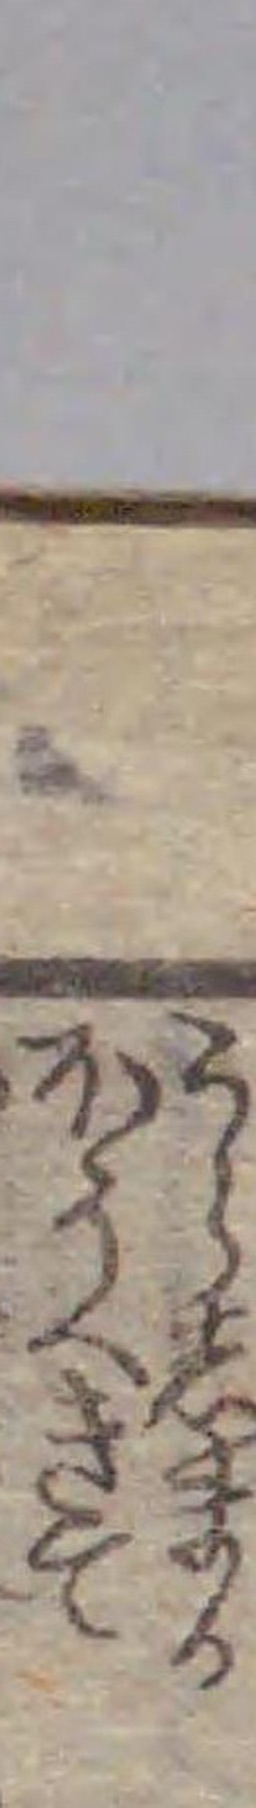ほうへきて
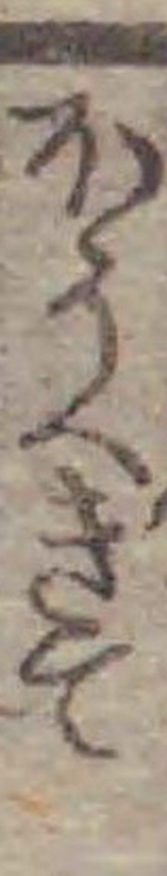ほうへきて
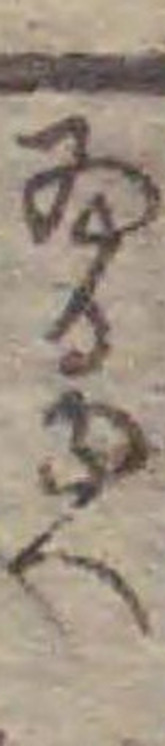ゐるゆへ
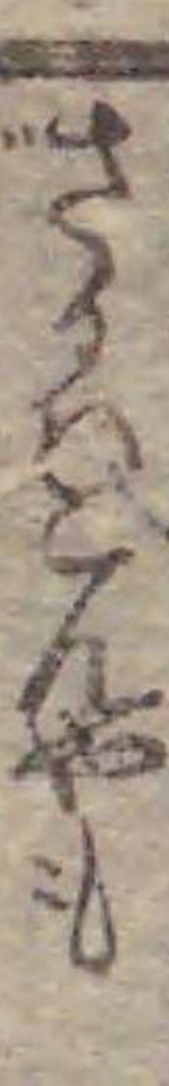さるはこんやも
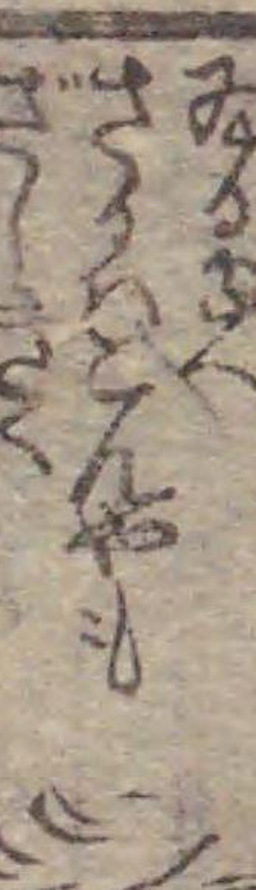さるはこんやも
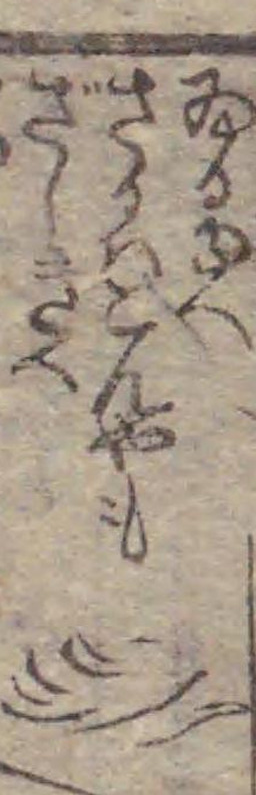さるはこんやも
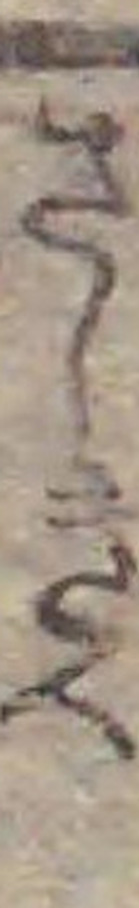ざしきへ
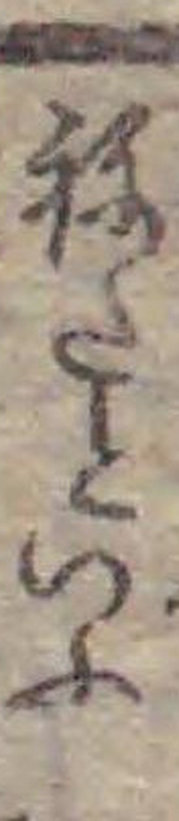ねたといふ
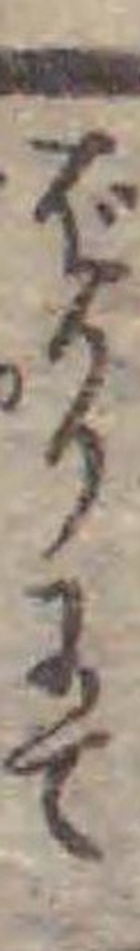ばかりにて
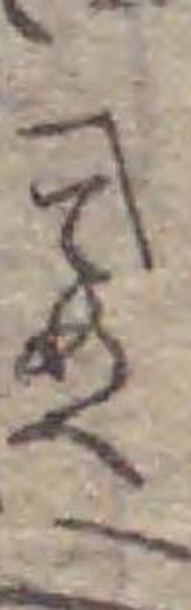〽てめへ
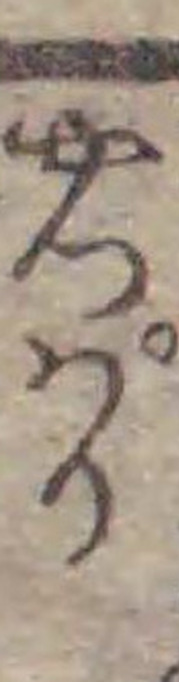やつぱり
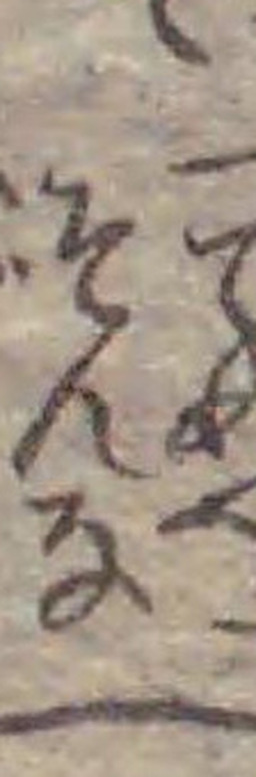そんな
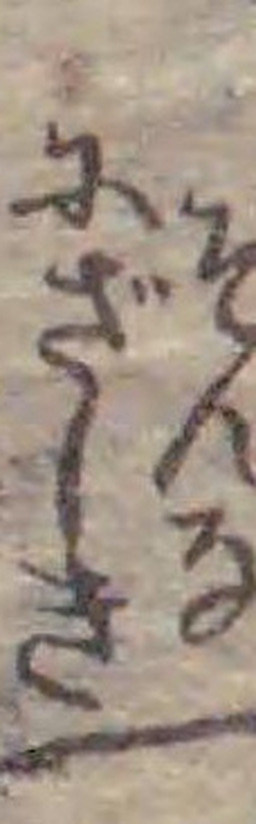にざしき
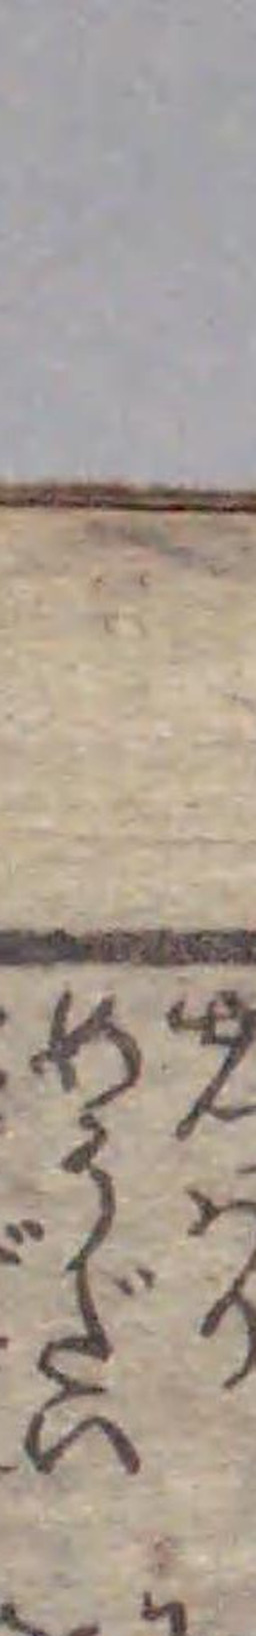めいだい
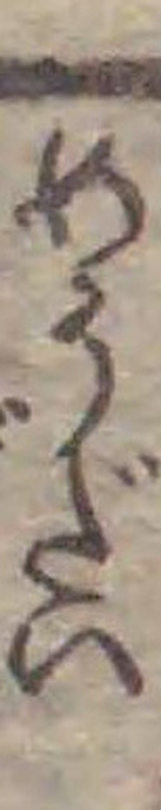めいだい
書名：竜宮苦界玉手箱 : 3巻
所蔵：国立国会図書館 National Diet Library, JAPAN
